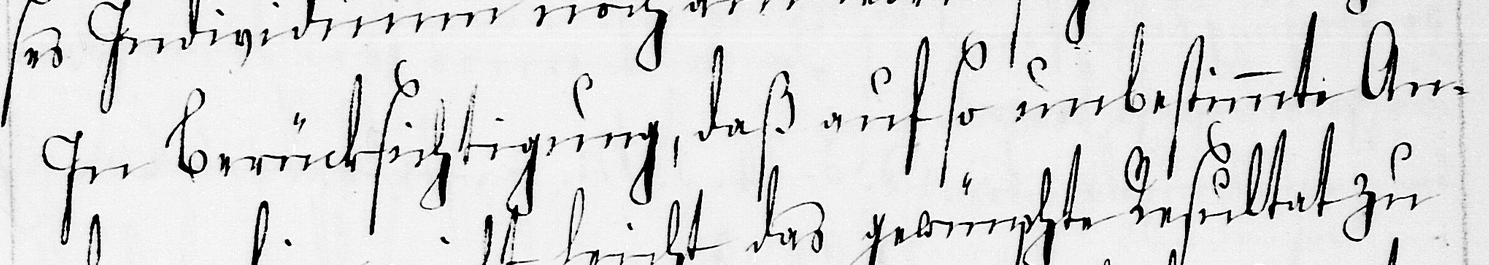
In Berücksichtigung, daß auf so unbestimmte An¬
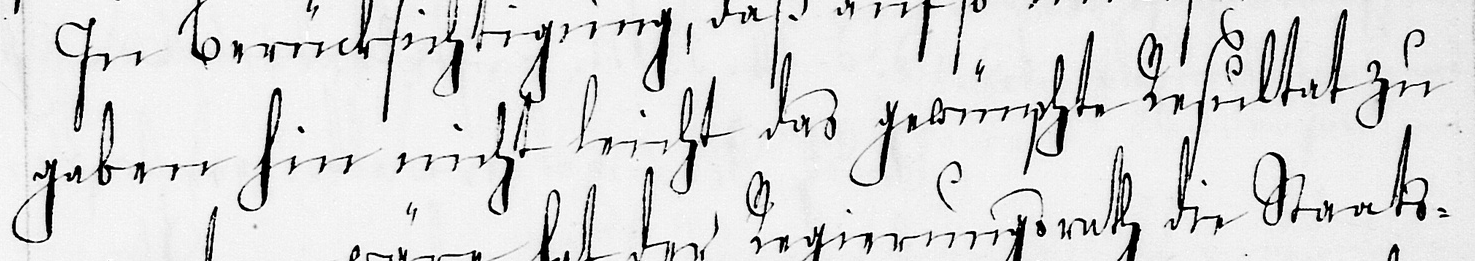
gaben hin nicht leicht das gewünschte Resultat zu
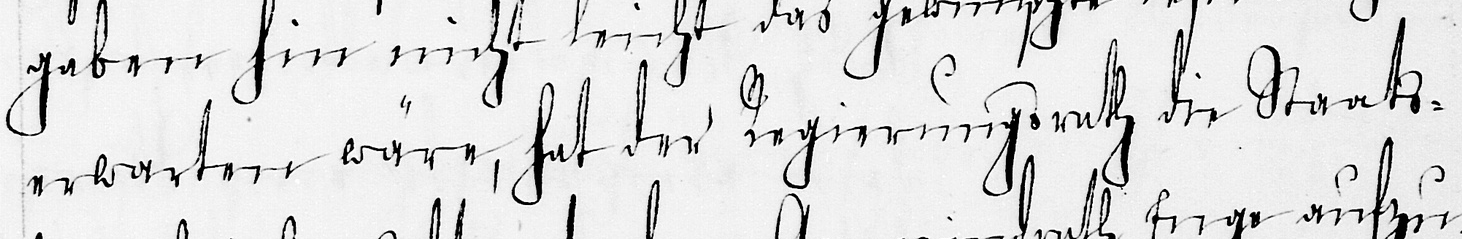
erwarten wäre, hat der Regierungsrath die Staats¬
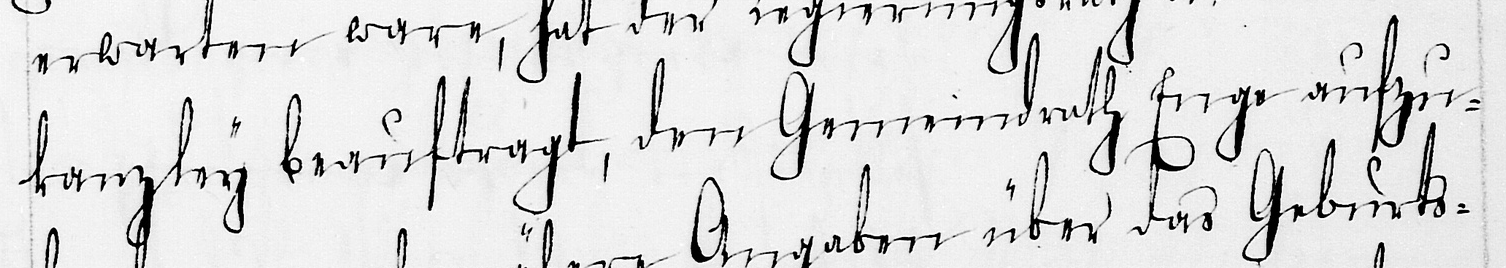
kanzley beauftragt, den Gemeindrath Enge aufzu¬
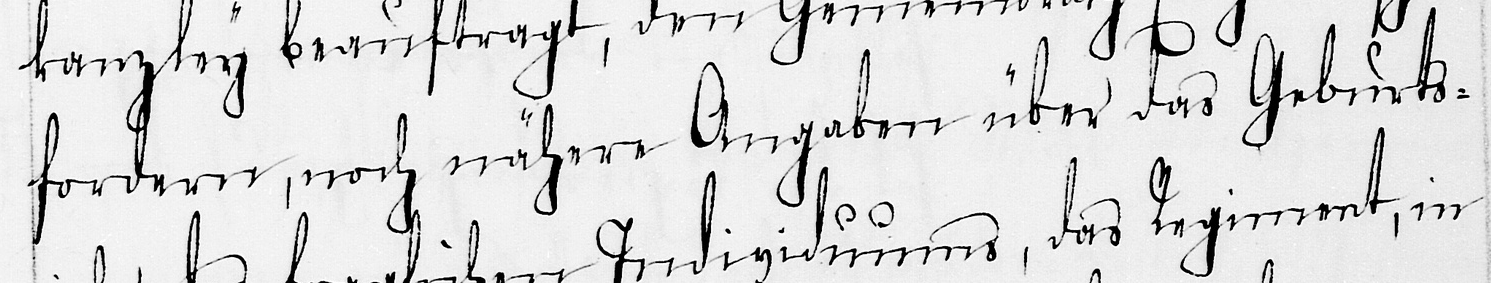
fordern, noch nähere Angaben über das Geburts¬
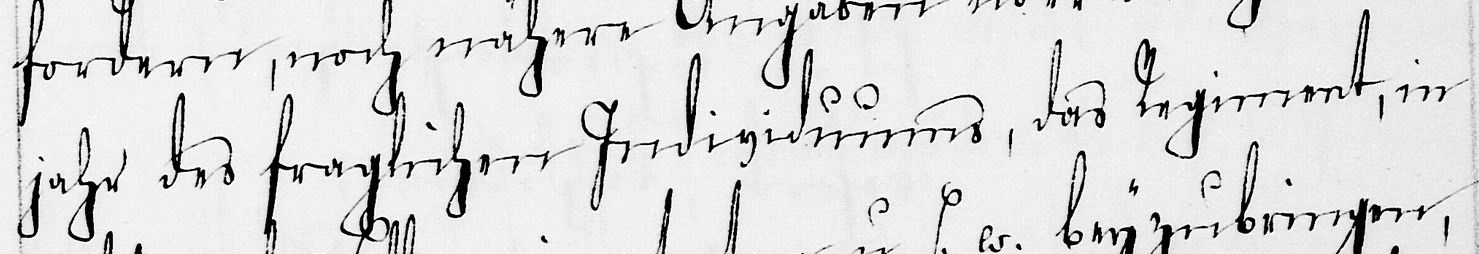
jahr des fraglichen Individuums, das Regiment, in
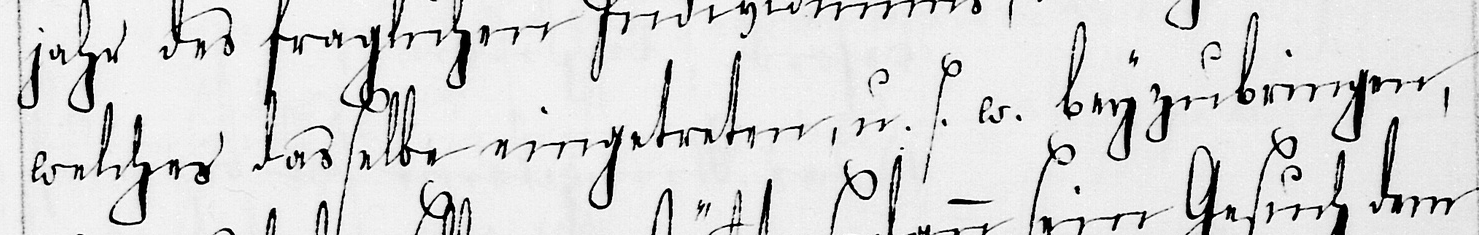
welches dasselbe eingetreten, u. s. w. beyzubringen,
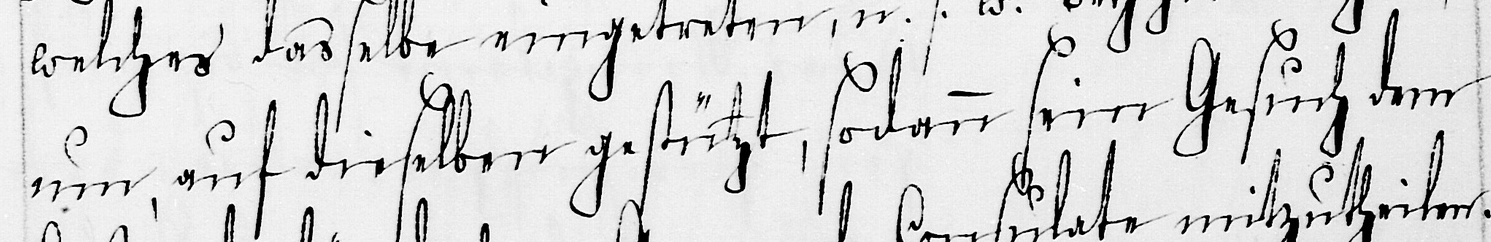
um, auf dieselben gestützt, sodann sein Gesuch dem
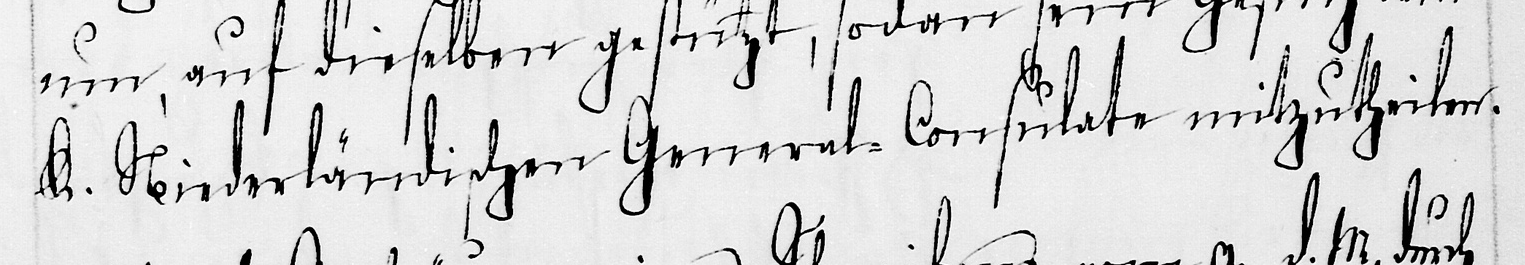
K. Niederländischen General-Consulate mitzutheilen.
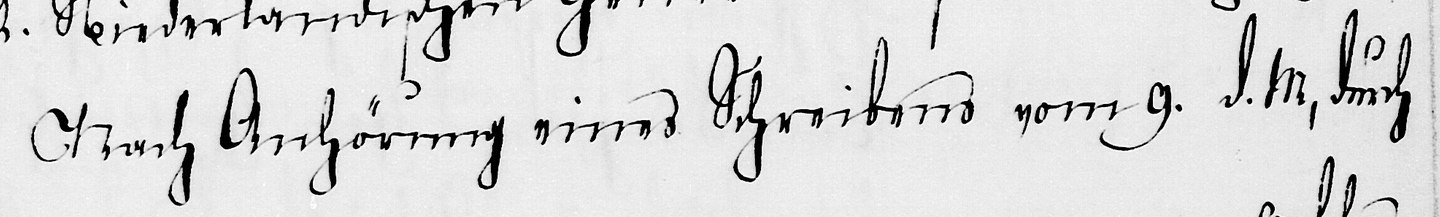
Nach Anhörung eines Schreibens vom 9. d. M, durch
